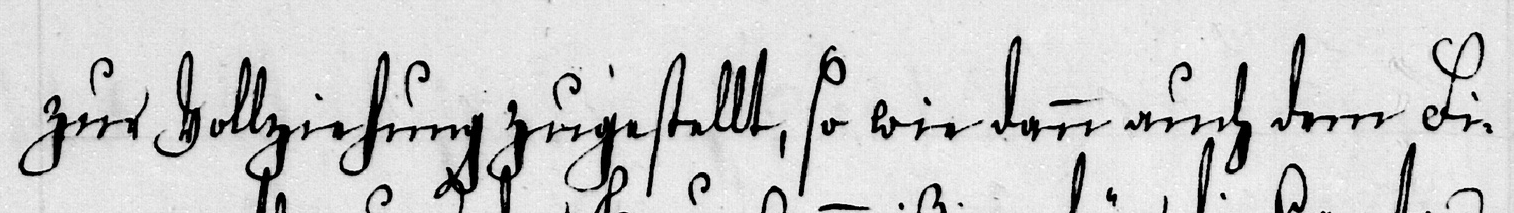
zur Vollziehung zugestellt, so wie dann auch dem Fi¬
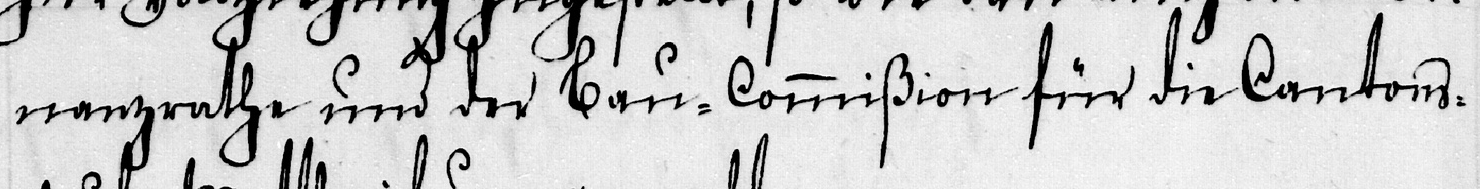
nanzrathe und der Bau-Commißion für die Cantons¬
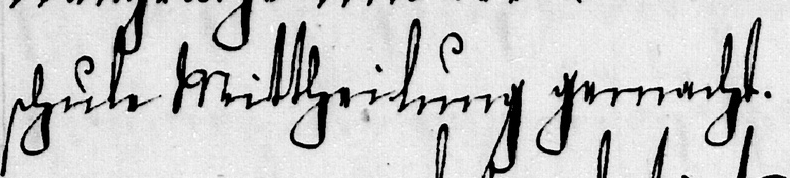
schule Mittheilung gemacht.
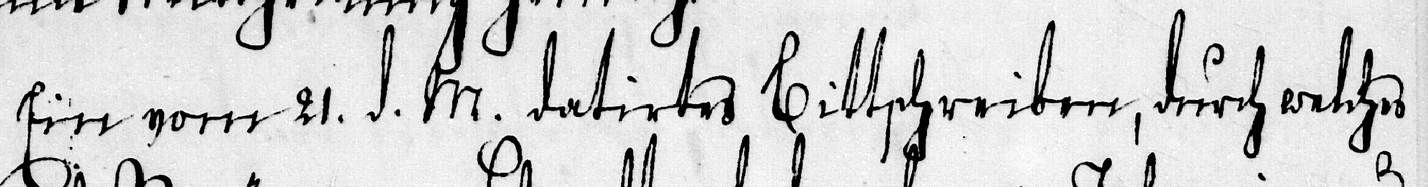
Ein vom 21. d. M. datirtes Bittschreiben, durch welches
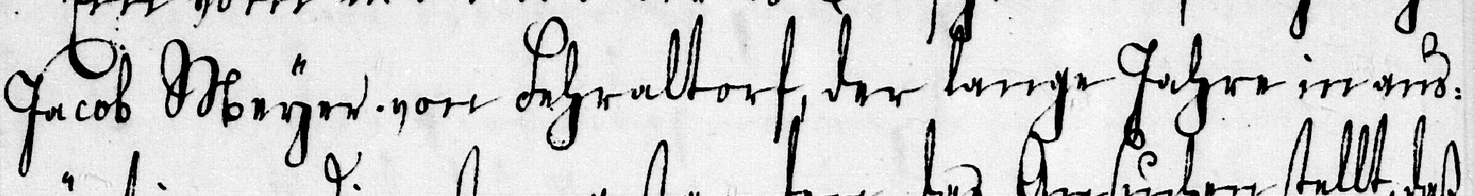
Jacob Meyer von Fehraltorf, der lange Jahre in aus¬
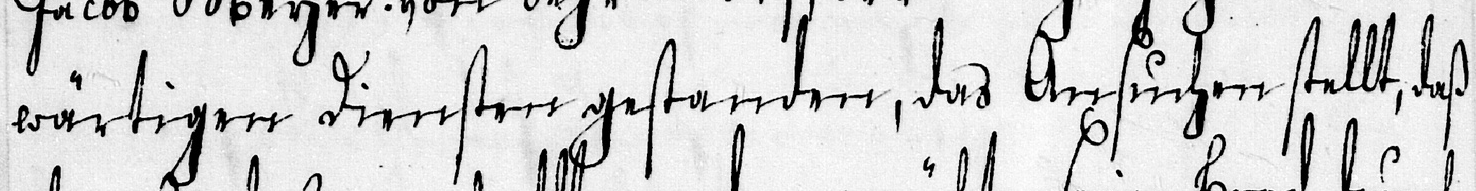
wärtigen Diensten gestanden, das Ansuchen stellt, daß
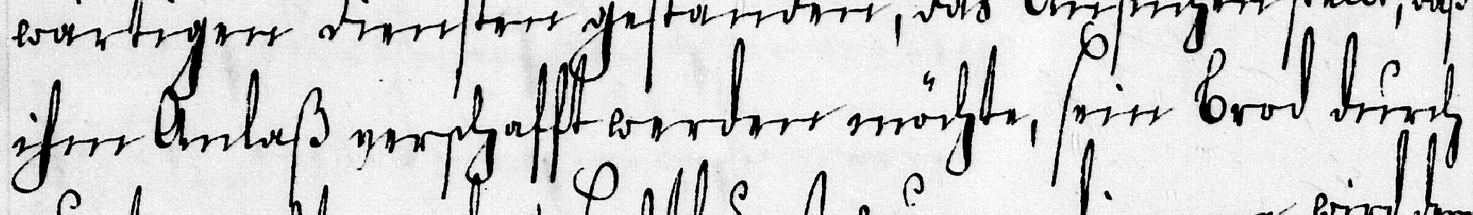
ihm Anlaß verschafft werden möchte, sein Brod durch
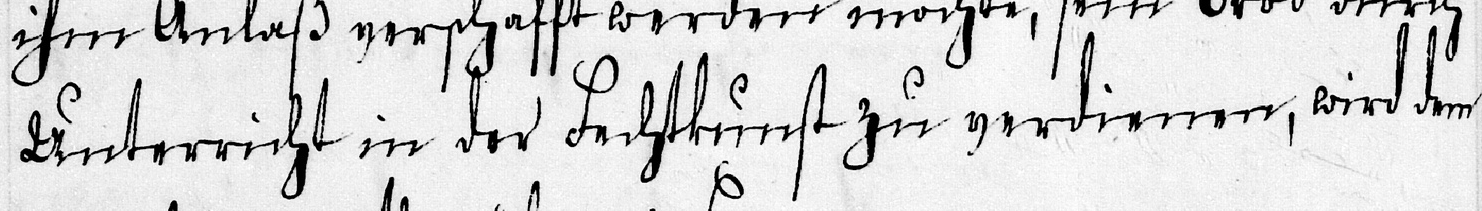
Unterricht in der Fechtkunst zu verdienen, wird dem
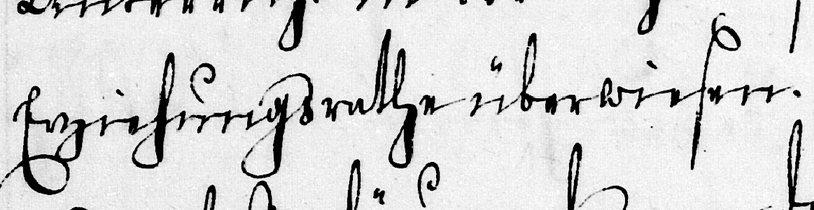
Erziehungsrathe überwiesen.
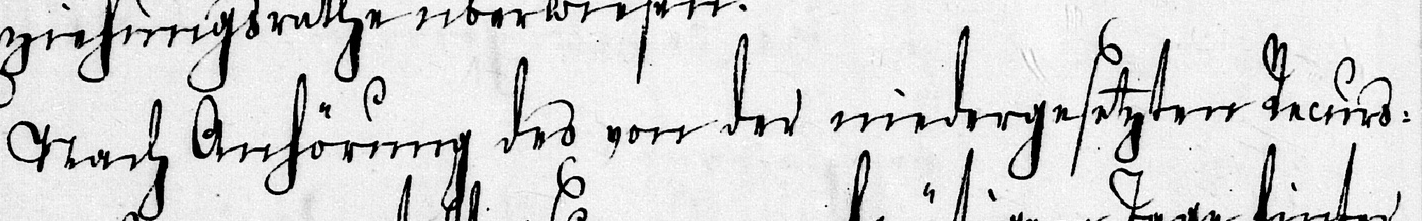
Nach Anhörung des von der niedergesetzten Recur¬
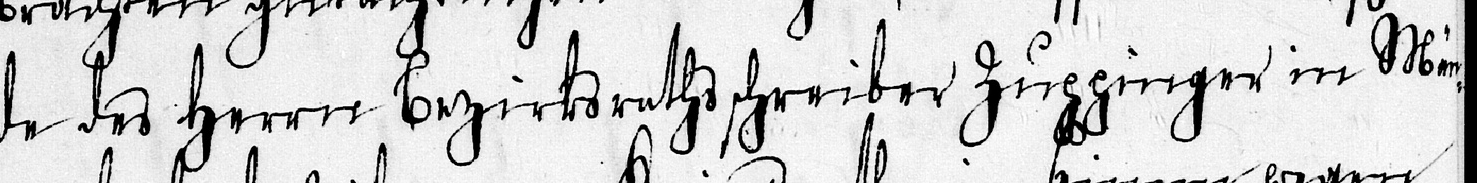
de des Herrn Bezirksrathsschreiber Zuppinger in Mä¬
